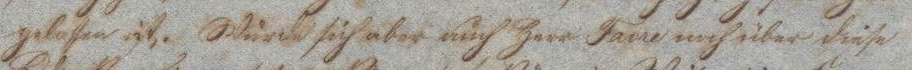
gelassen ist. Würde sich aber auch Herr Favre noch über diese
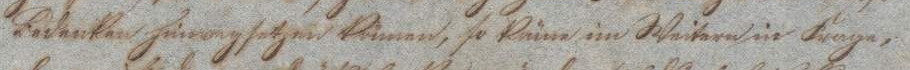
Bedenken hinwegsetzen können, so käme im Weitern in Frage,
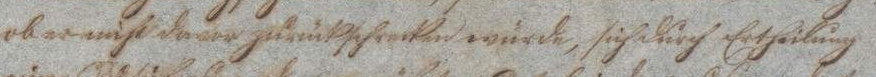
ob er nicht davor zurückschrecken würde, sich durch Ertheilung
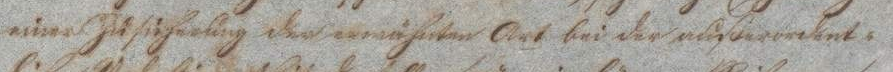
einer Zusicherung der erwähnten Art bei der außerordent-
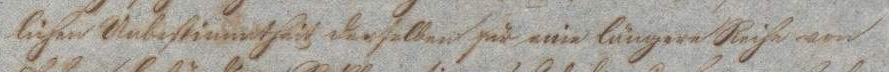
lichen Unbestimmtheit derselben für eine längere Reihe von
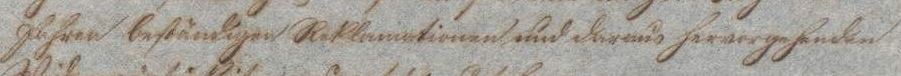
Jahren beständigen Reklamationen und daraus hervorgehenden
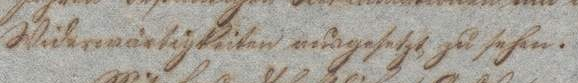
Widerwärtigkeiten ausgesetzt zu sehen.
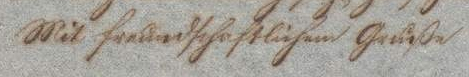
Mit freundschaftlichem Gruße
